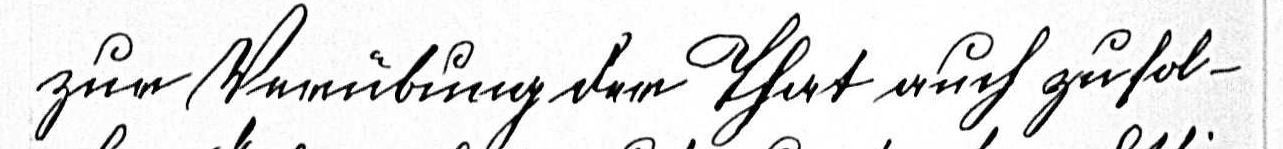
zur Verübung der That auch zu sol¬
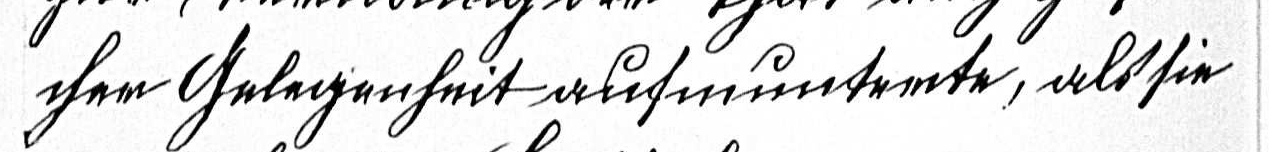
cher Gelegenheit aufmunterte, als sie
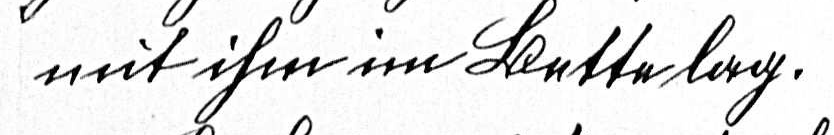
mit ihm im Bette lag.
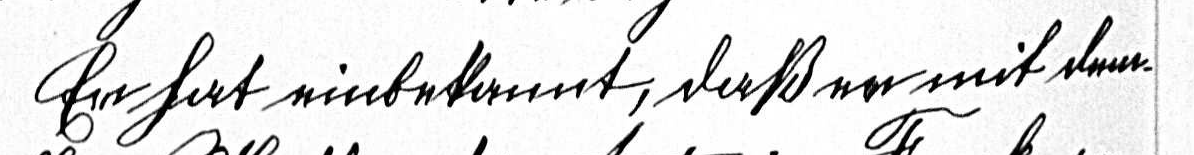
Er hat einbekannt, daß er mit dem¬
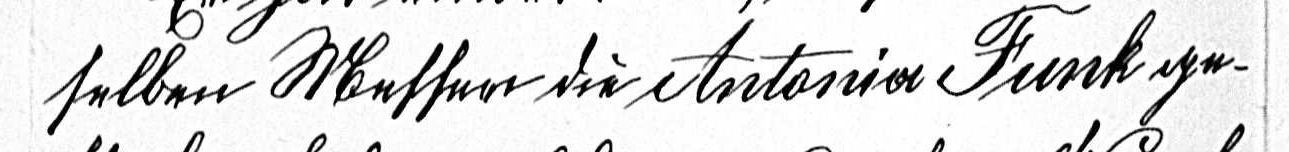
selben Messer die Antonia Funk ge¬
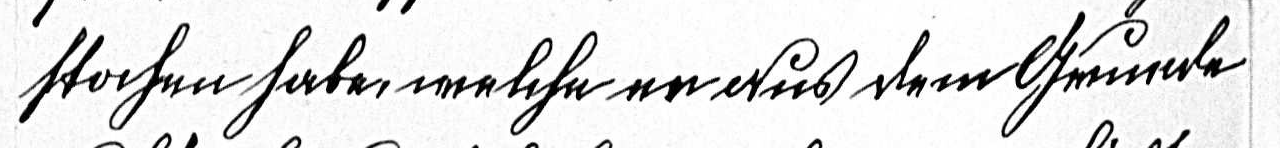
stochen habe, welche er aus dem Grunde
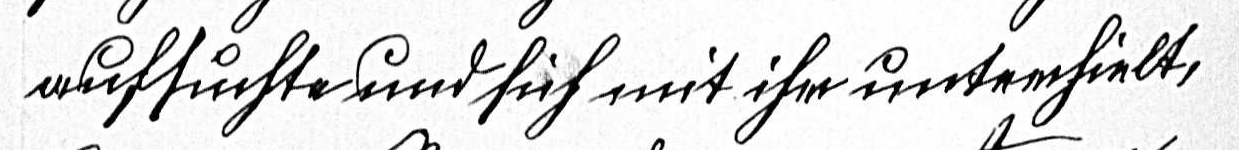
aufsuchte und sich mit ihr unterhielt,
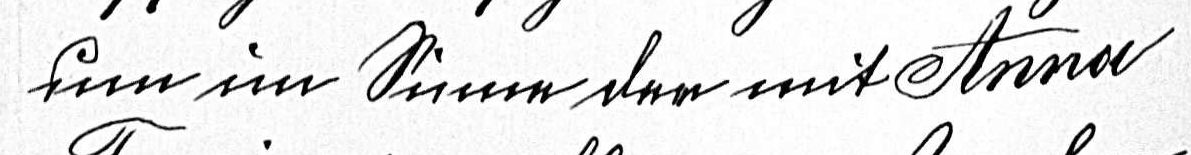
um im Sinne der mit Anna
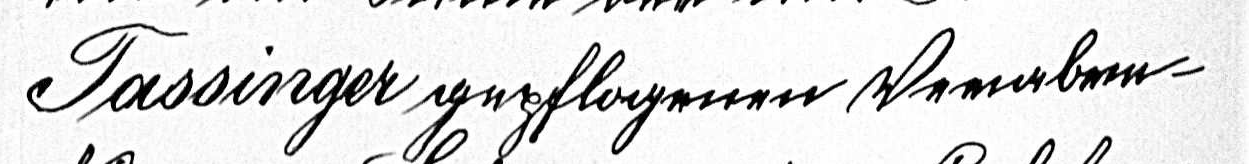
Tassinger gepflogenen Verabre¬
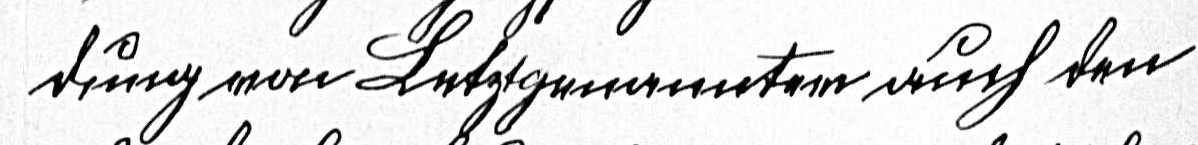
dung von Letztgenannter auch den
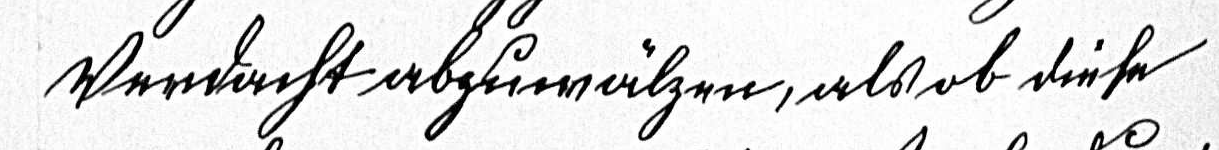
Verdacht abzuwälzen, als ob diese
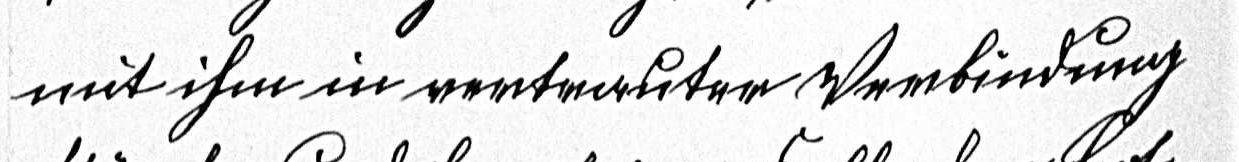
mit ihm in vertrauter Verbindung
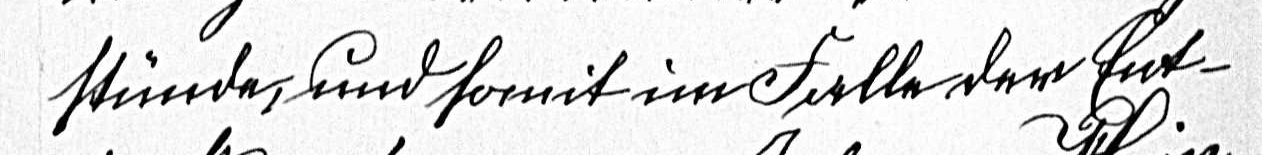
stünde, und somit im Falle der Ent¬
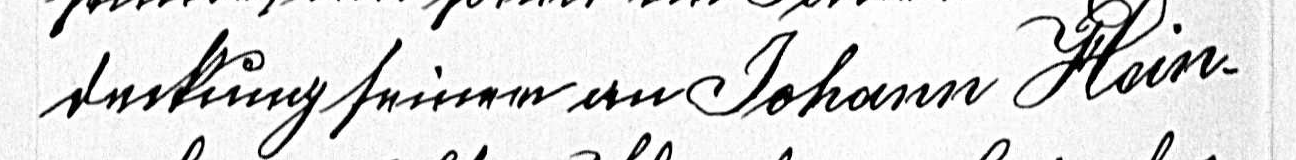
deckung seiner an Johann Hein¬
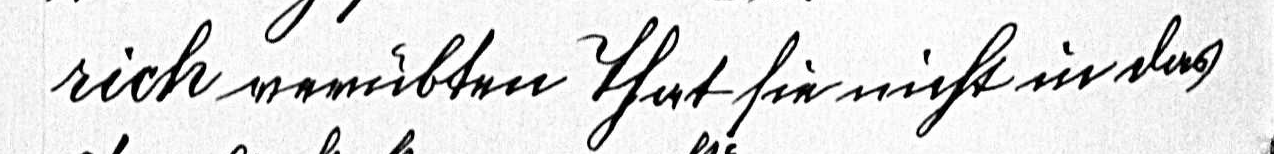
rich verübten That sie nicht in das
